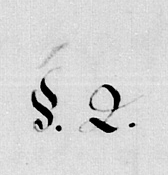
§. 3.
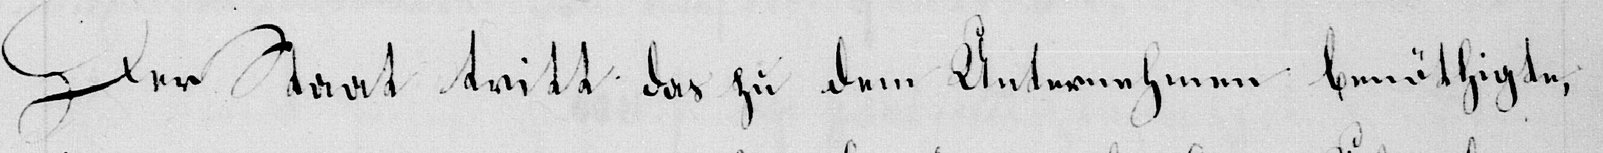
Der Staat tritt das zu dem Unternehmen benöthigte,
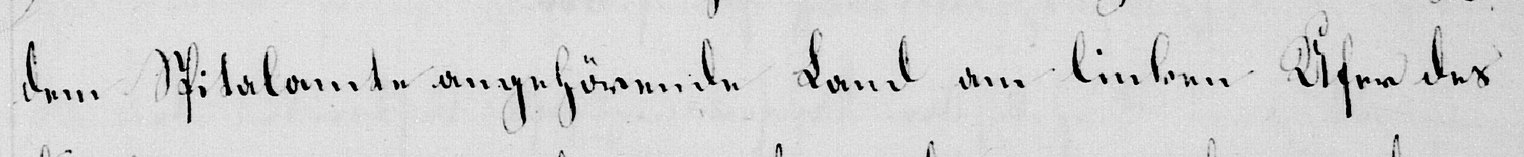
dem Spitalamte angehörende Land am linken Ufer des
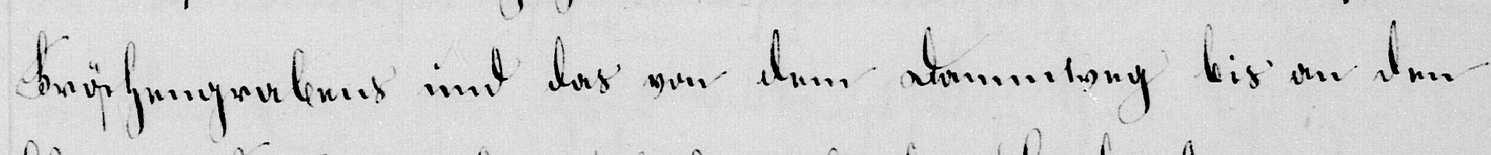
Fröschengrabens und das von dem Dammweg bis an den
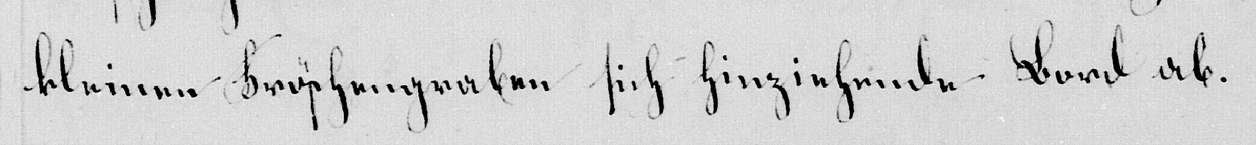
kleinen Fröschengraben sich hinziehende Land ab.
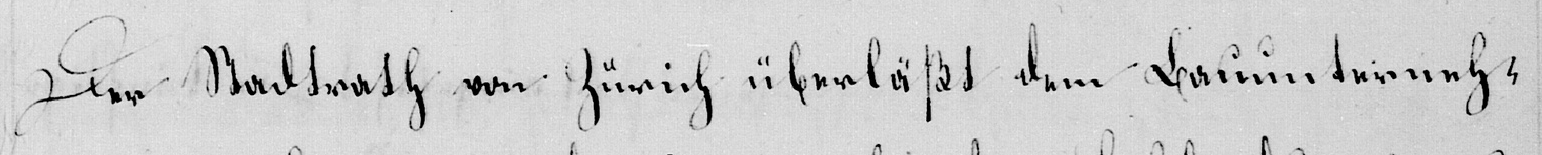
Der Stadtrath von Zürich überläßt dem Bauunterneh¬
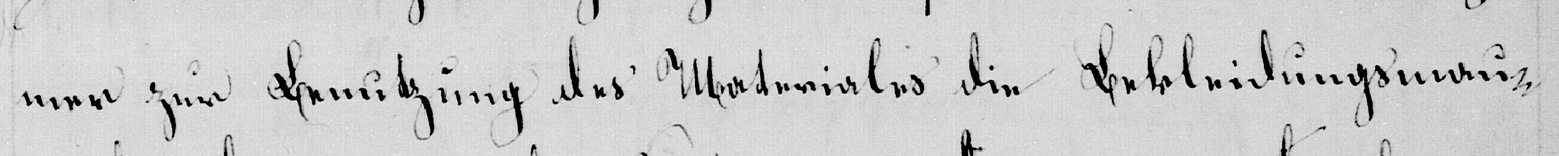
mer zur Benützung des Materiales die Bekleidungsmau¬
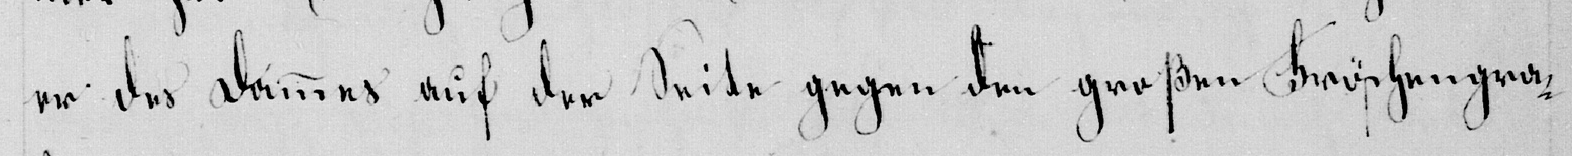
er des Dammes auf der Seite gegen den großen Fröschengra¬
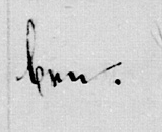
ben.
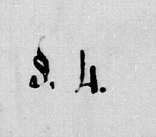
§. 4.
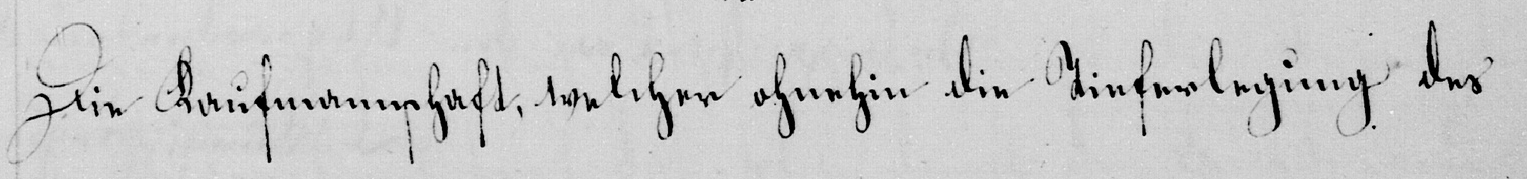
Die Kaufmannschaft, welcher ohnehin die Tieferlegung des
